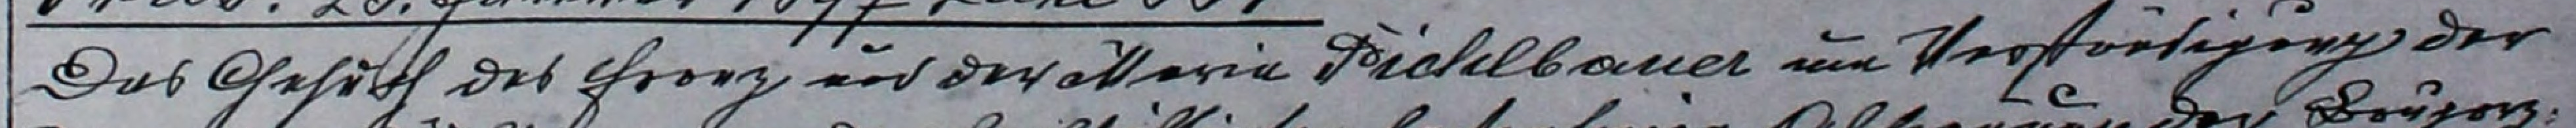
Das Gesuch des Franz und der Maria Pichlbauer um Verständigung der
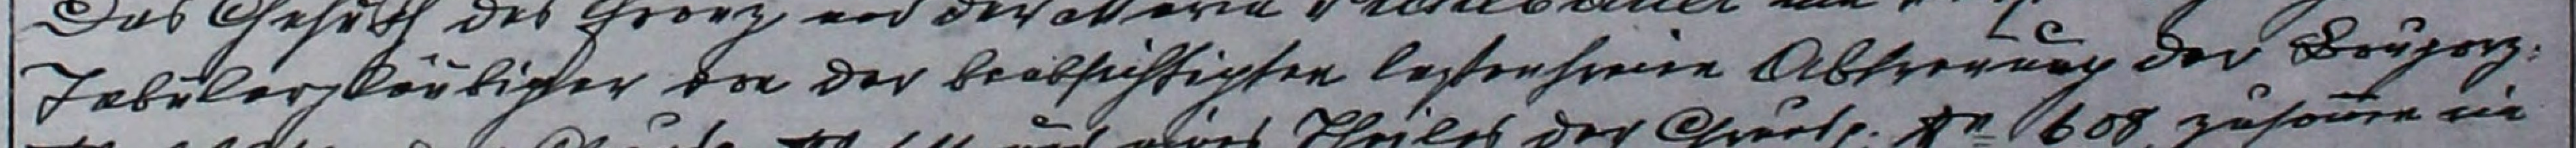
Tabulargläubiger von der beabsichtigten lastenfreien Abtrennung der Bauparz:
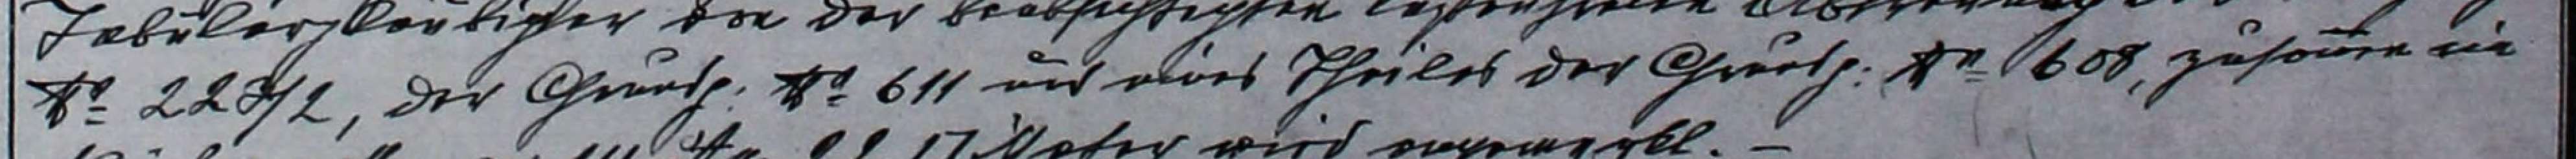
No 227/2, der Grundp: No 611 und eines Theiles der Grundp: No 608, zusonnen ein
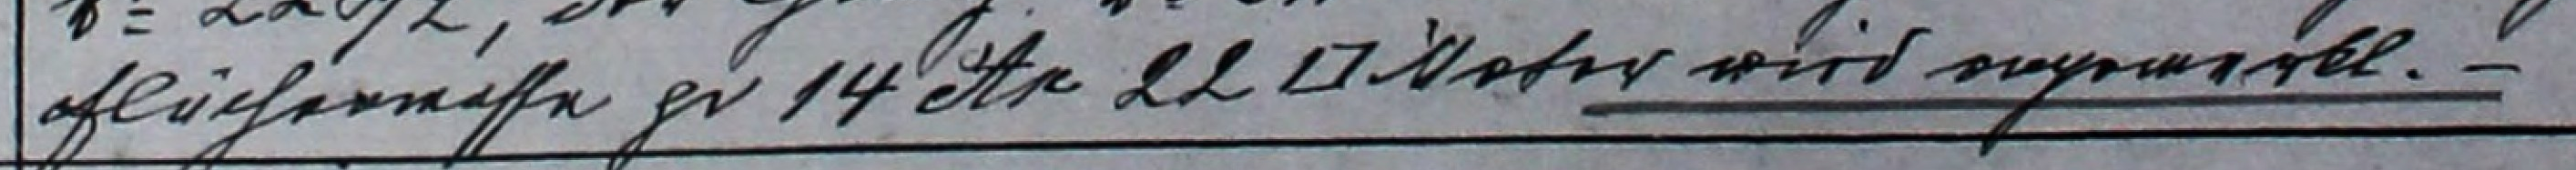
Flächenmesse pr 14 An 22 Öketer wird angemerkt. -
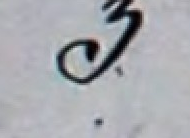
3
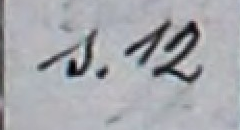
s. 12
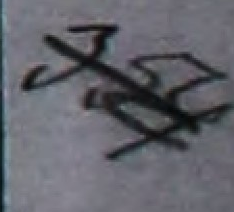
354
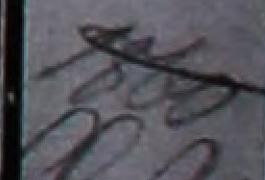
1860
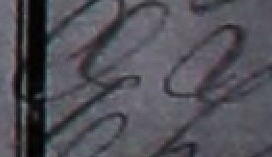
???
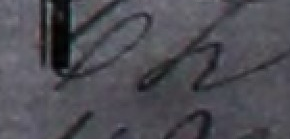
?h
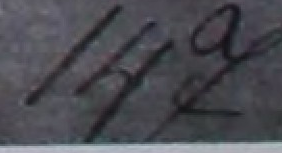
147
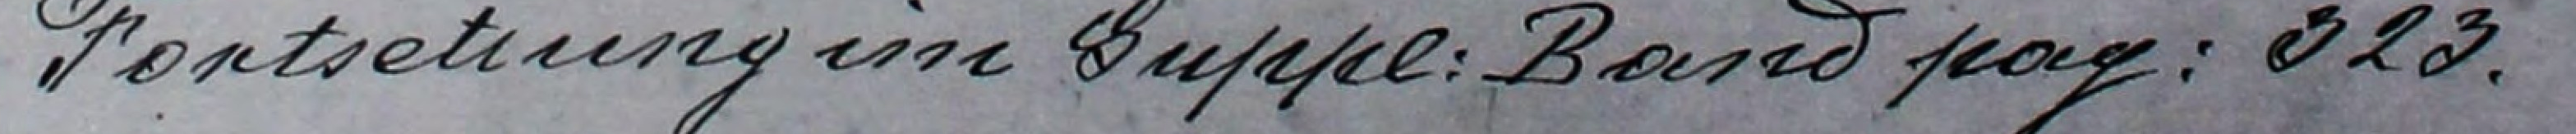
Fortsetzung im Guppe: Band pag: 323.
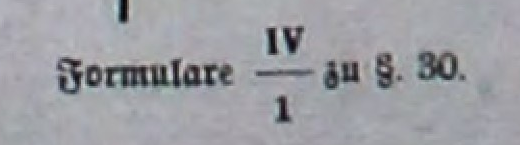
Formulare IV/1 zu §. 30.
